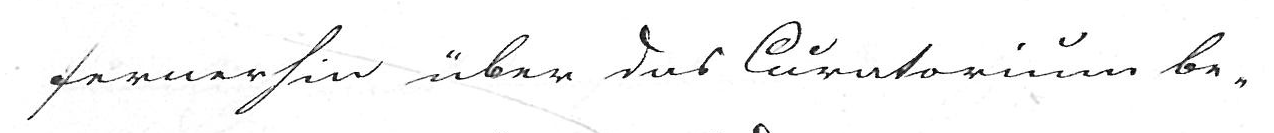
fernerhin über das Curatorium be-
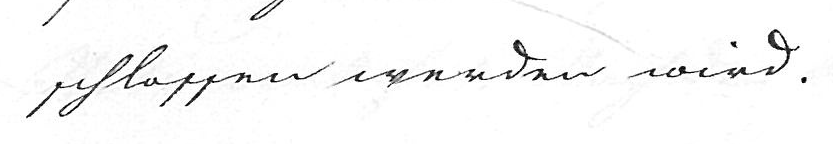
schlossen werden wird.
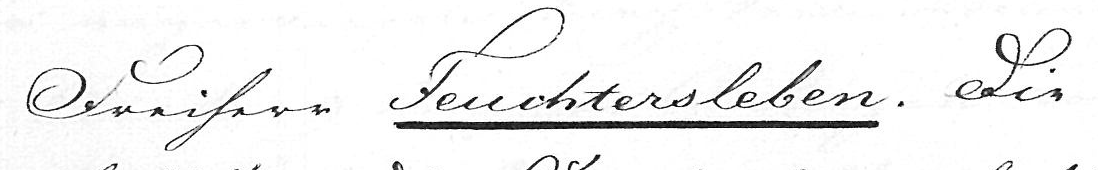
Freiherr Feuchtersleben. Die
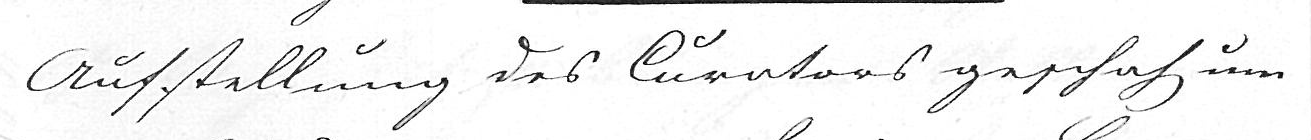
Aufstellung des Curators geschah um
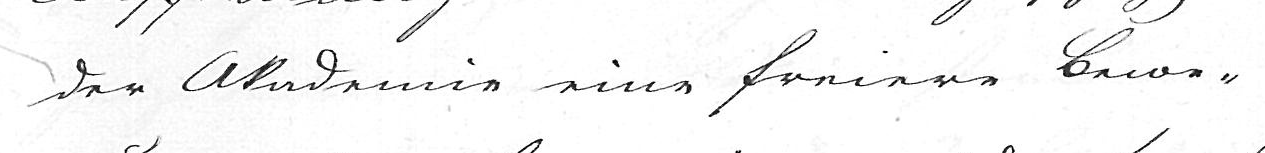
der Akademie eine freiere Bewe-
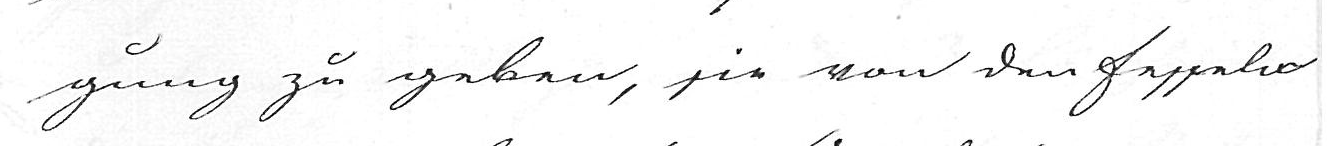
gung zu geben, sie von den Fesseln
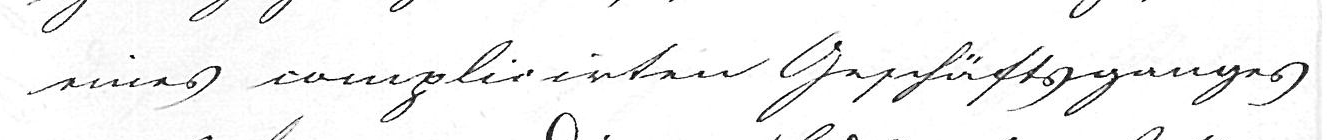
eines complicirten Geschäftsganges
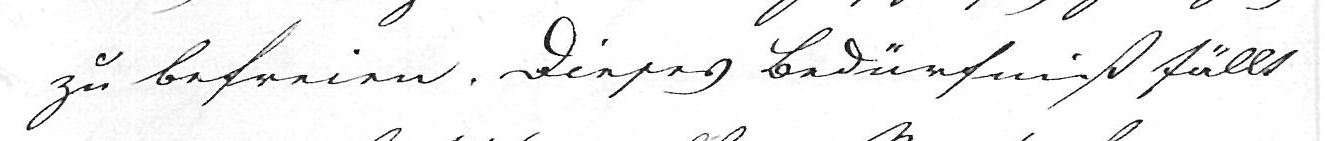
zu befreien. Dieses Bedürfniß fällt
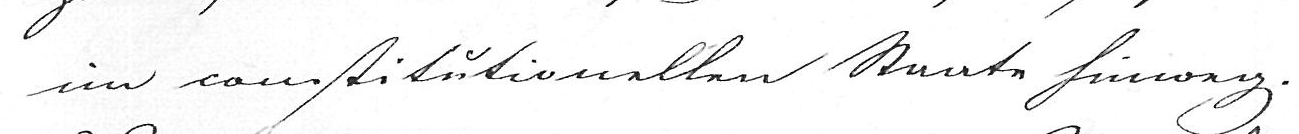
im constitutionellen Staate hinweg.
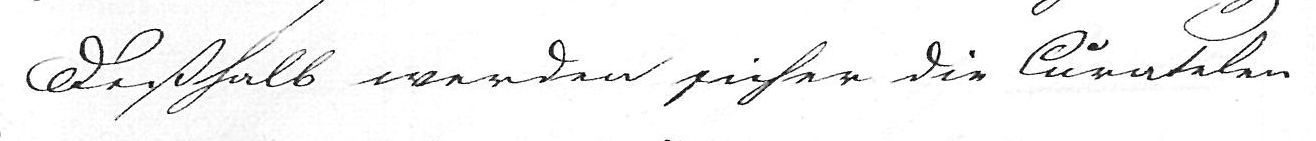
Deßhalb werden sicher die Curatelen
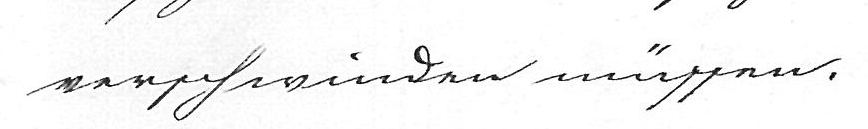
verschwinden müssen.
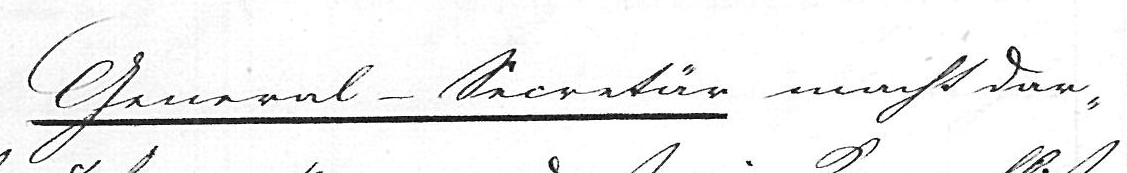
General-Secretär macht dar-
